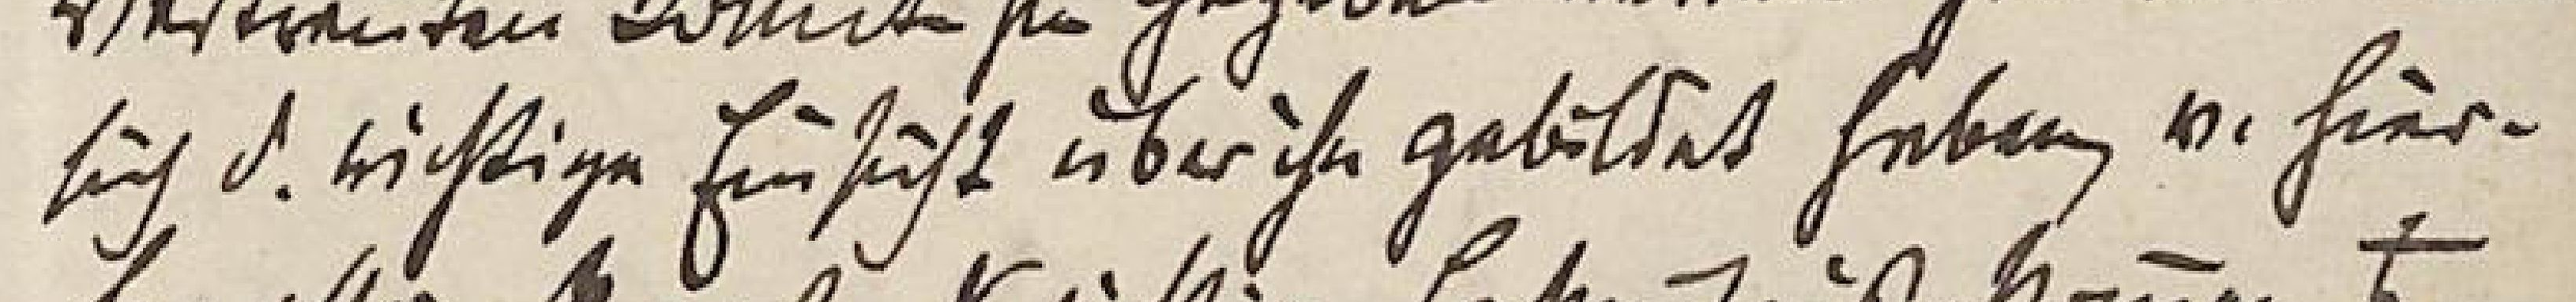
sich d. richtige Einsicht über ihn gebildet haben, v. hier¬
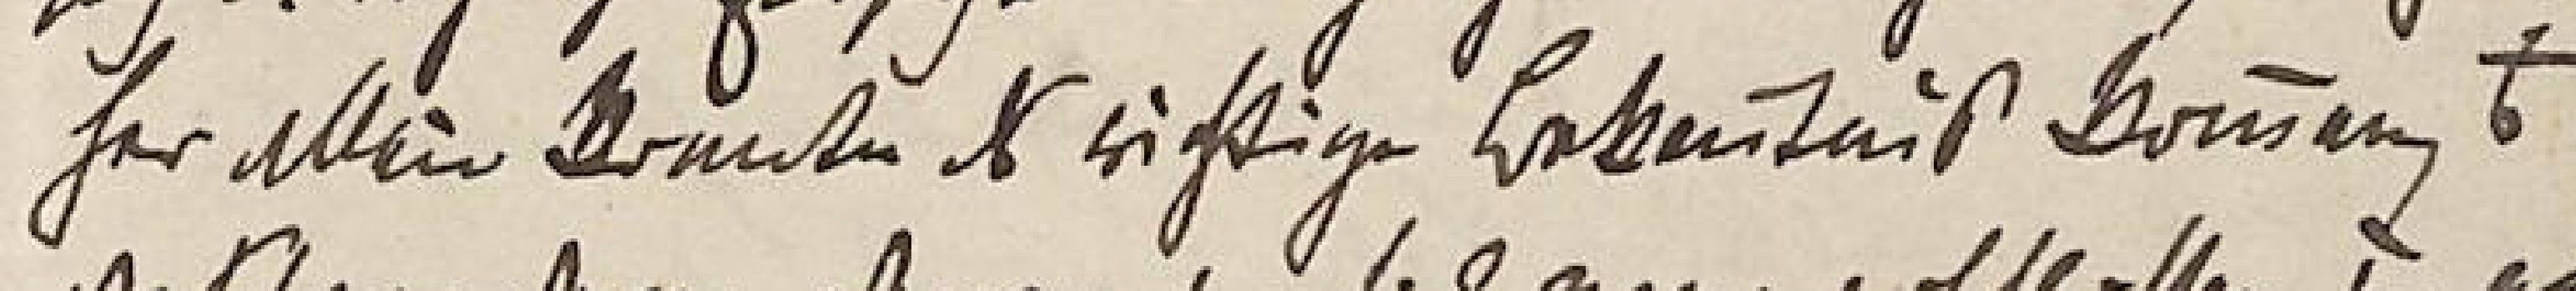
her allein konnte ds richtige Bekentnis komen, s
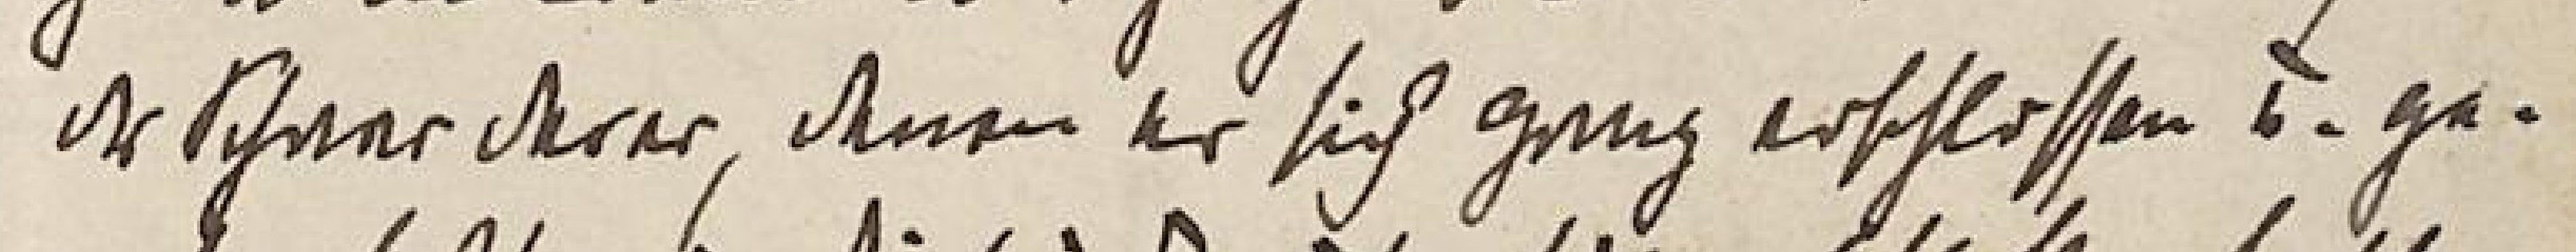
der Schaar derer, denn er sich ganz erschlossen u. ge¬
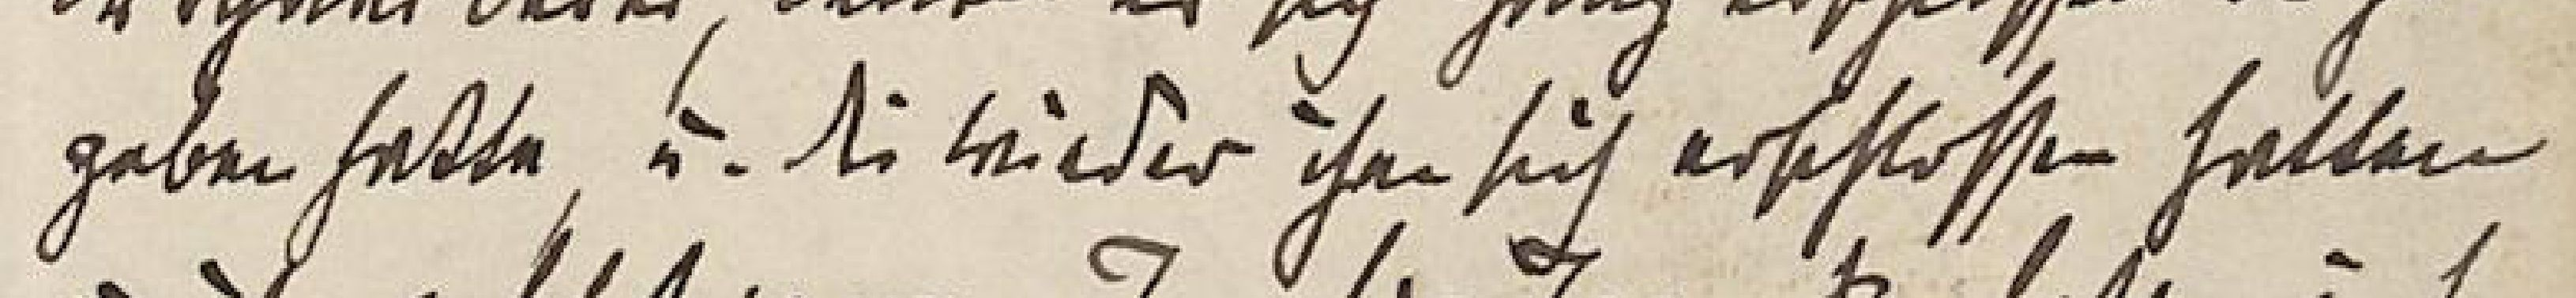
geben hatte, u. die wieder ihm sich erschlossen hatten
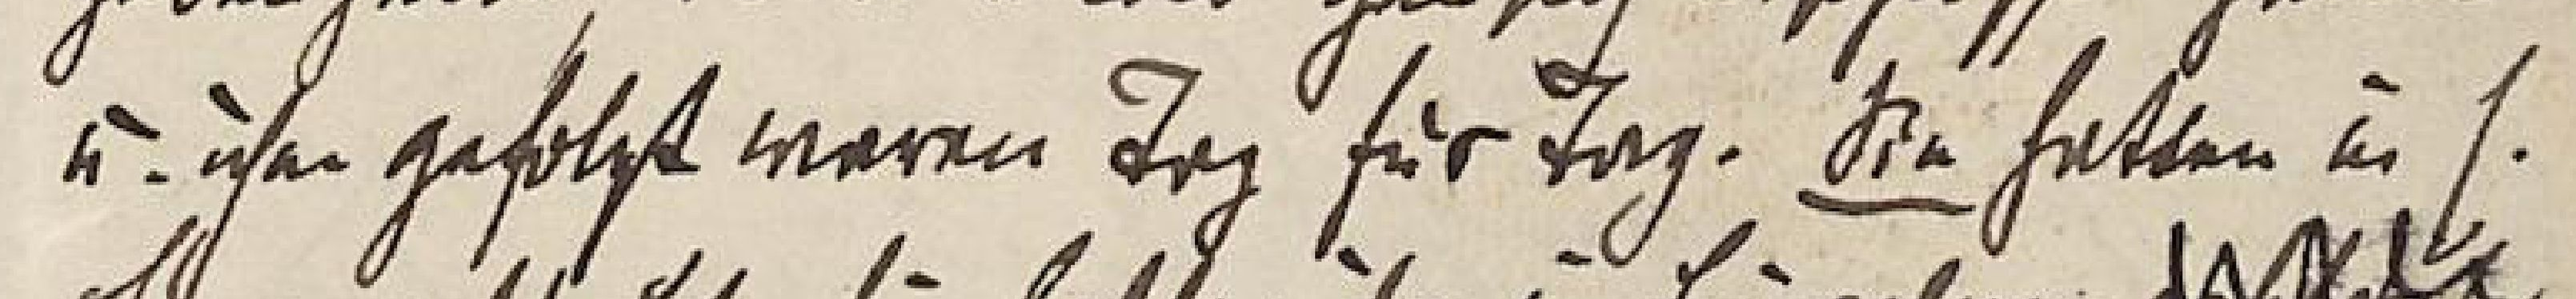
u. ihm gefolgt waren Tag für Tag. Sie hatten in s.
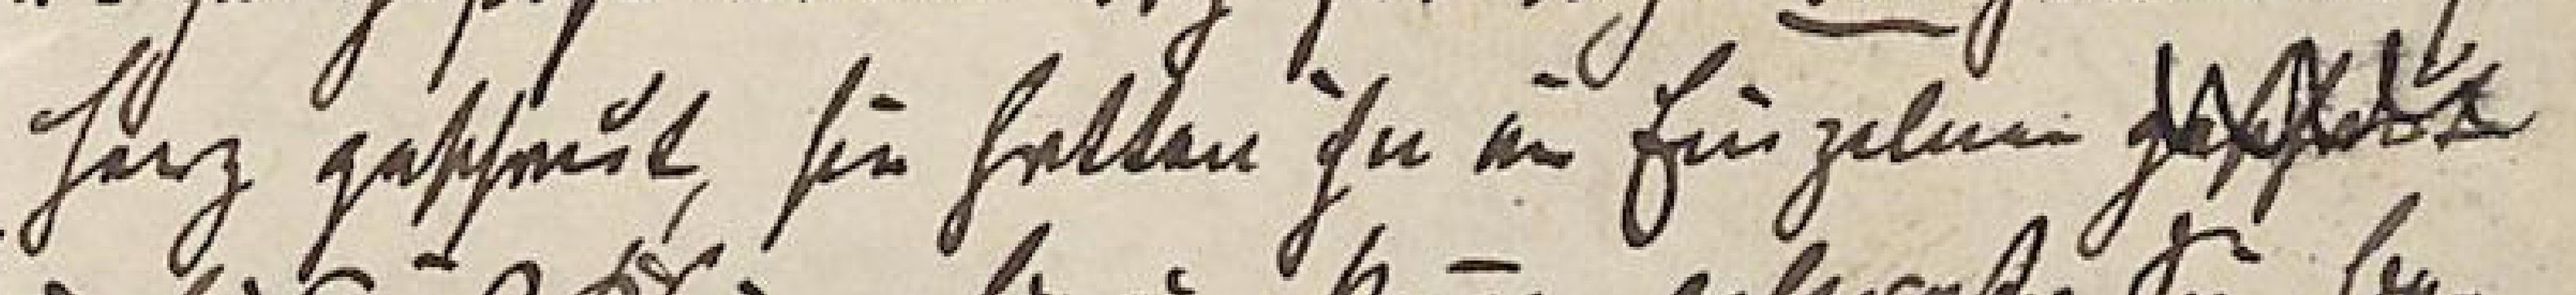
Herz geschaut, sie hatten ihn im Einzelen geschaut
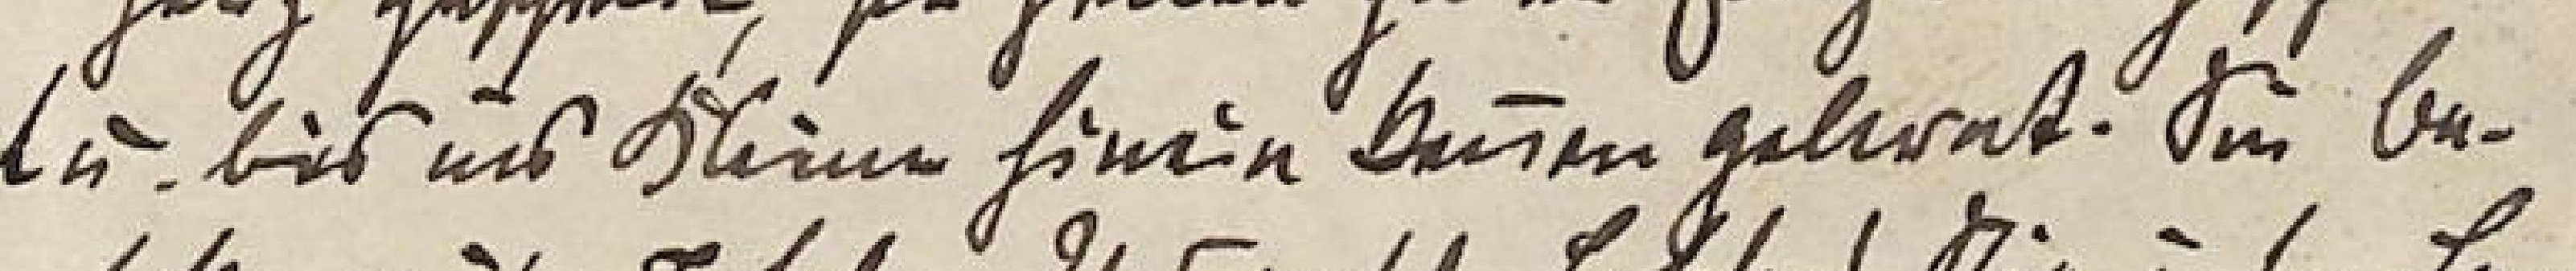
u. bis ins Kleine hinein kenen gelernt. Sie be¬
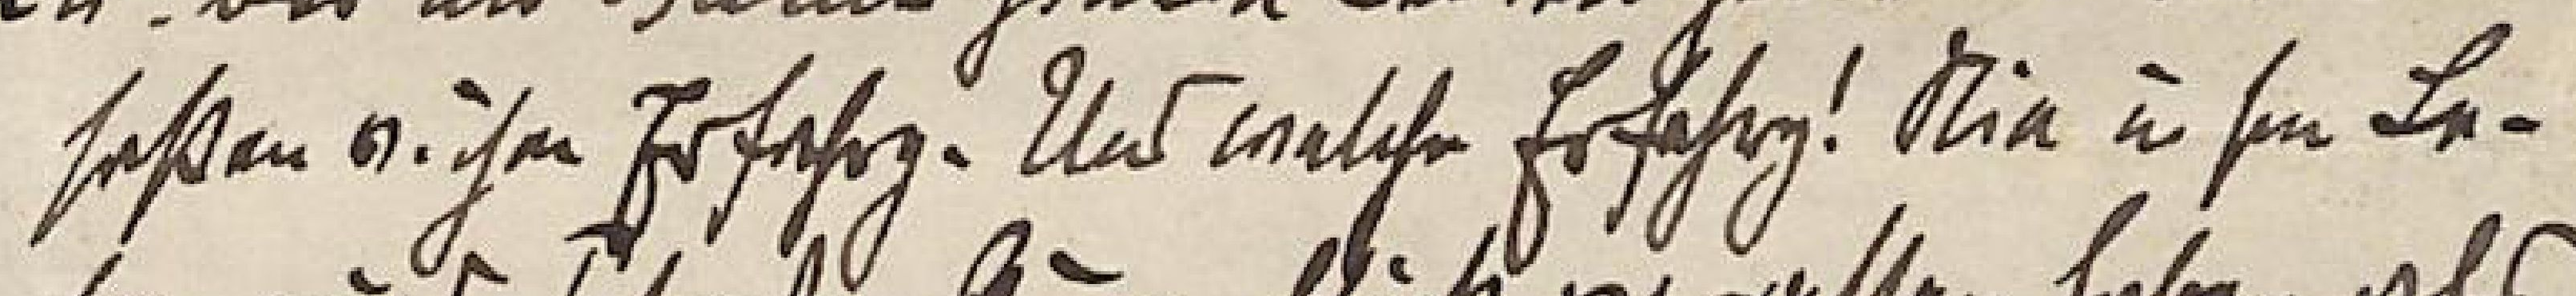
saßen v. ihm Erfahrg. Und welche Erfahrg! Nie in sm Le¬
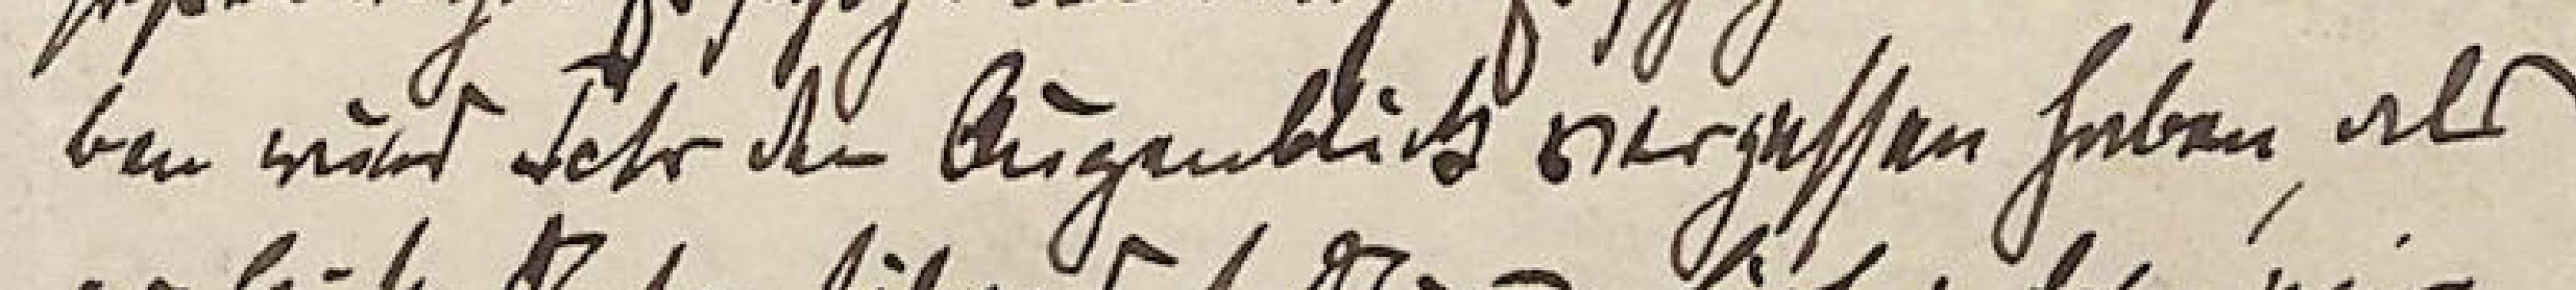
ben wird Petr. den Augenblick vergessen haben, als
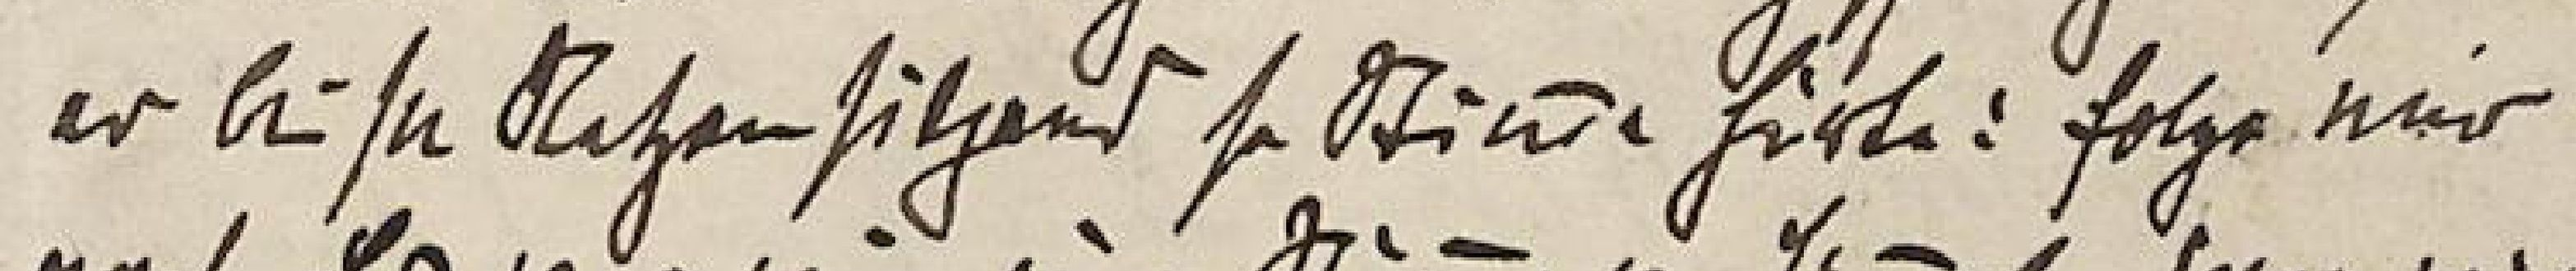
er bei sn Netzen sitzend sn Stime hörte: folge mir
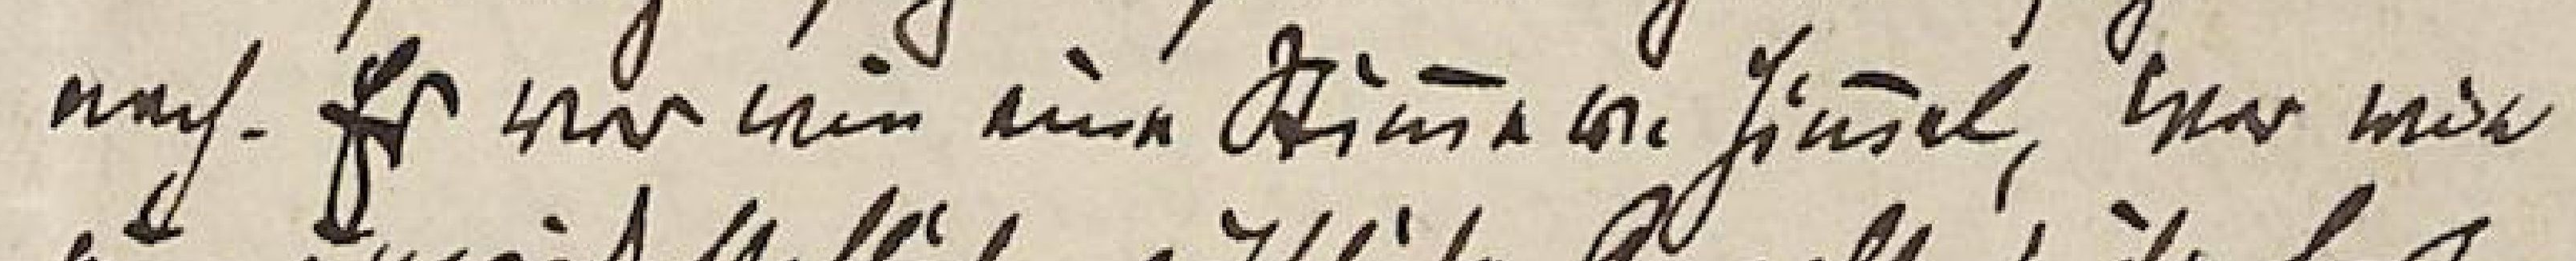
nach. Es war wie eine Stime v. Himel, war wie
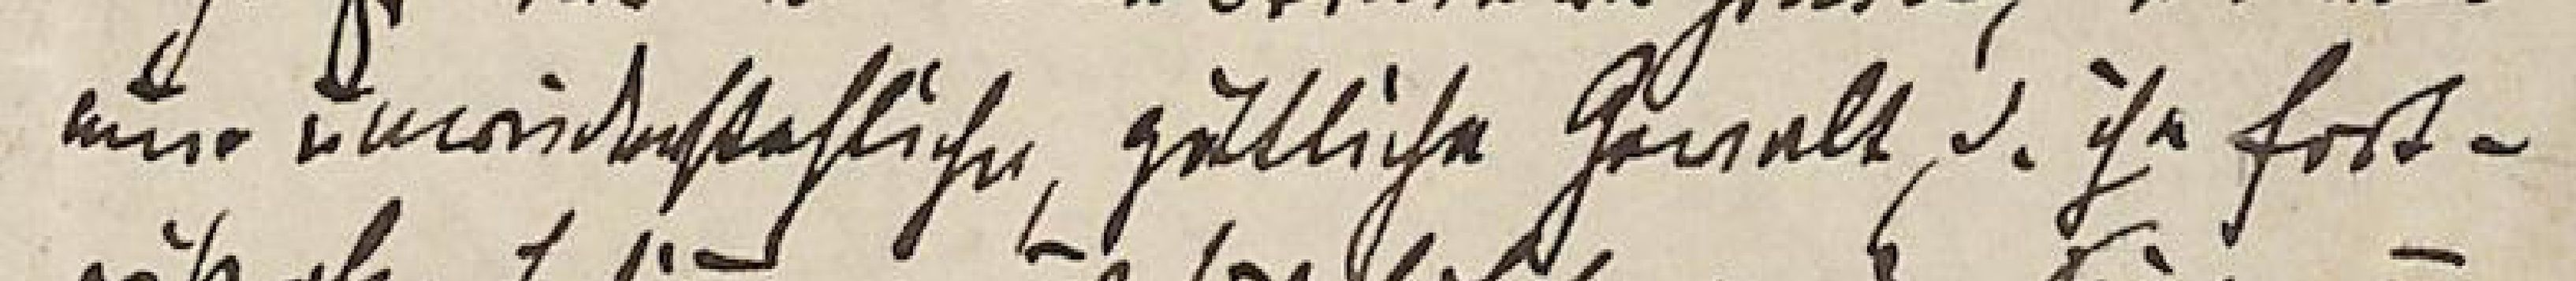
eine unwidderstehliche, göttliche Gewalt, d. ihn fort¬
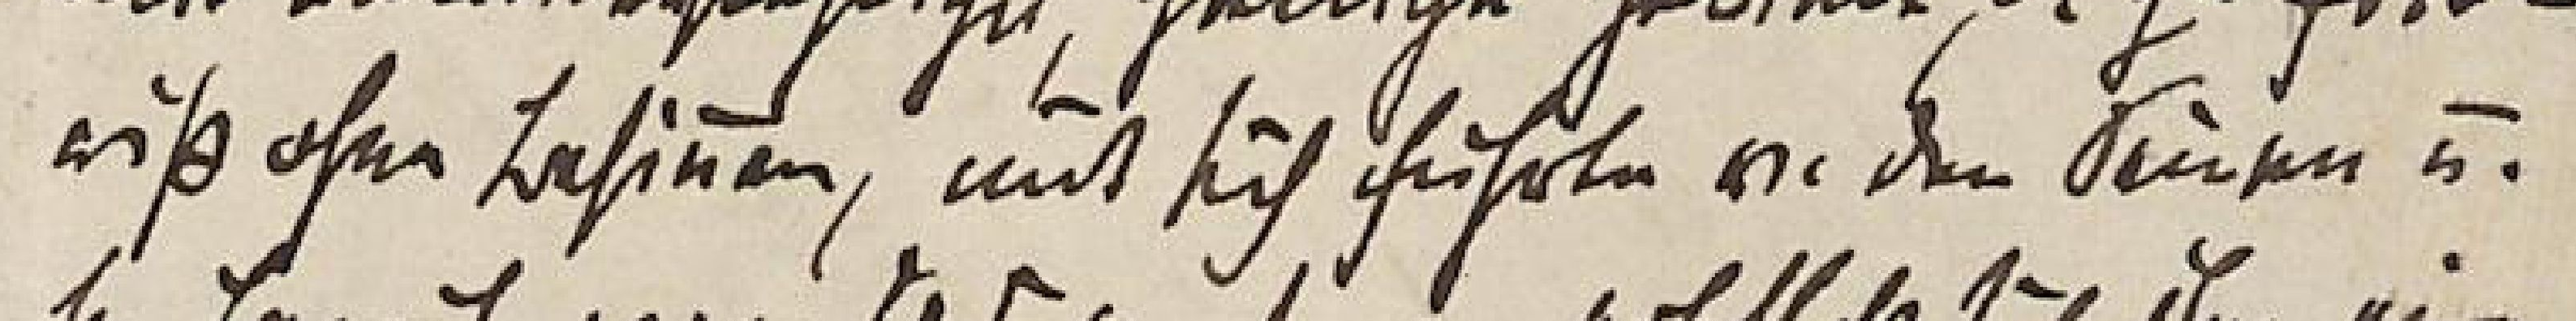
riß ohne Besinen, mit sich führte v. den Seinen u.
